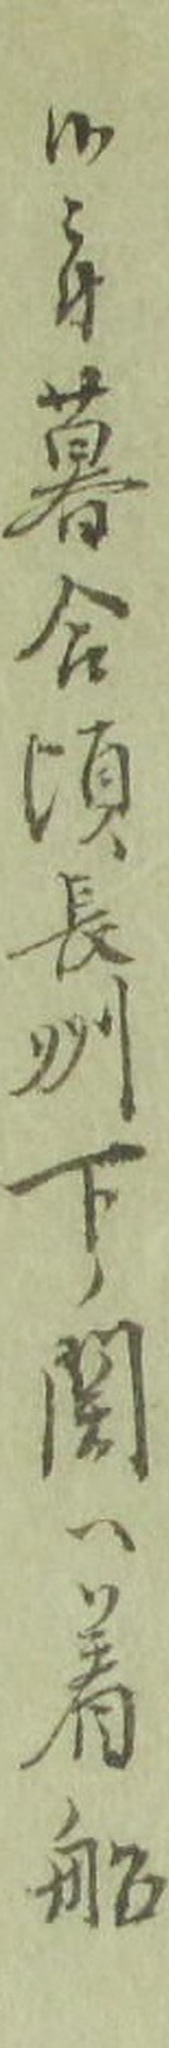候に付暮合頃長州下ノ関へ着船
